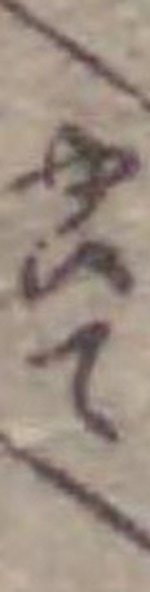やいて
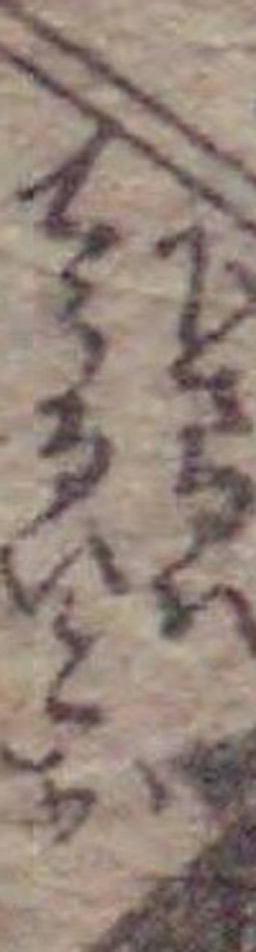てうるいとお
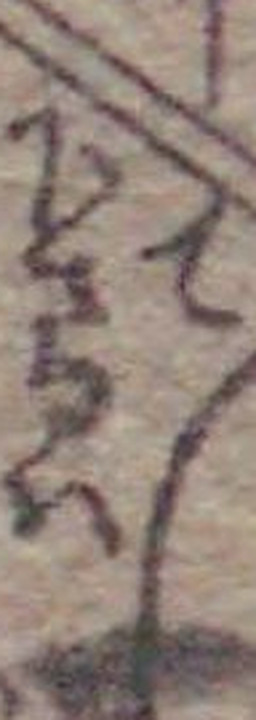下さるは

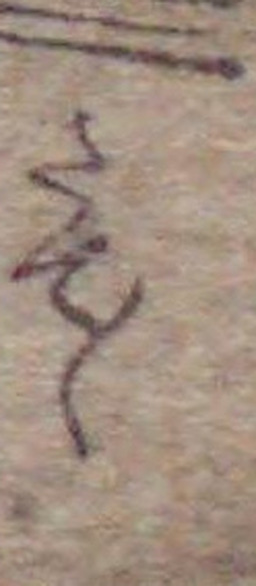さて〳〵
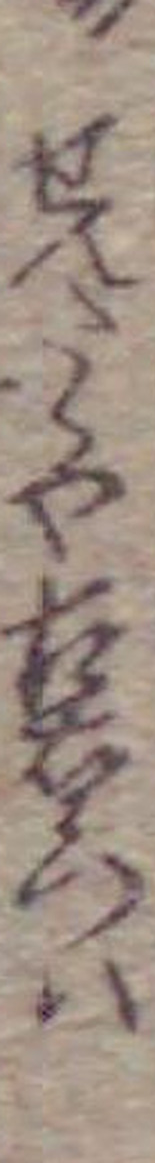せんたくや古右衛門は
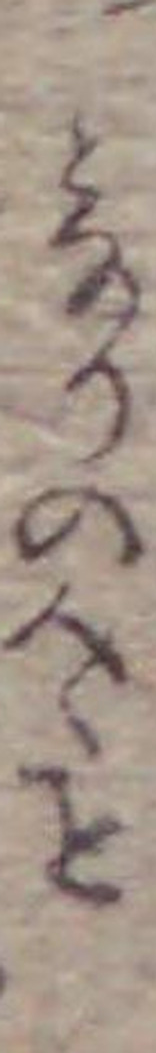ちなりの人〳〵を
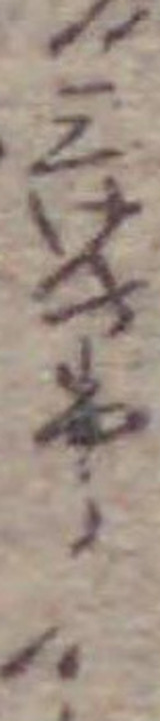三けんりやう
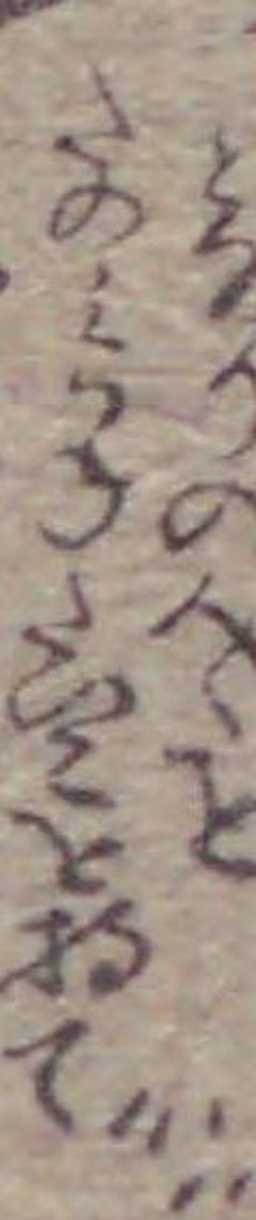たのみかねたいこを持て
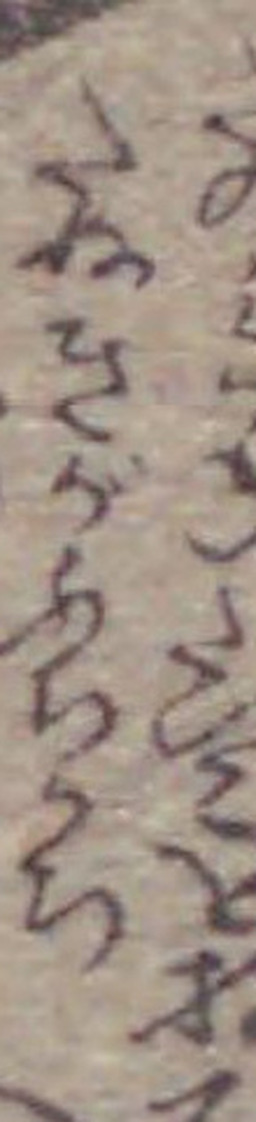たぬきがふちかち
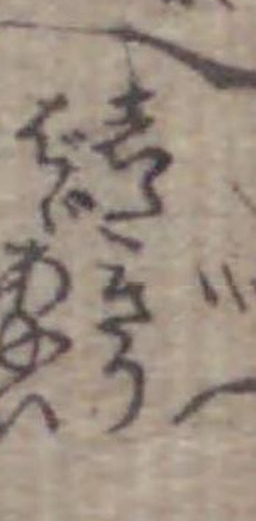ばゞあやい
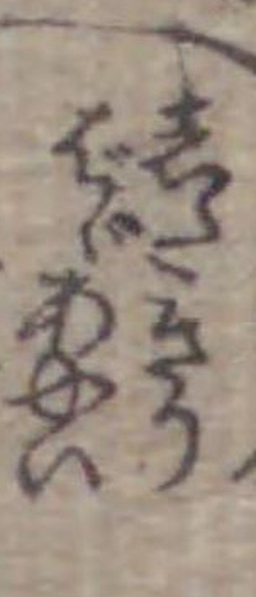ばゞあやい
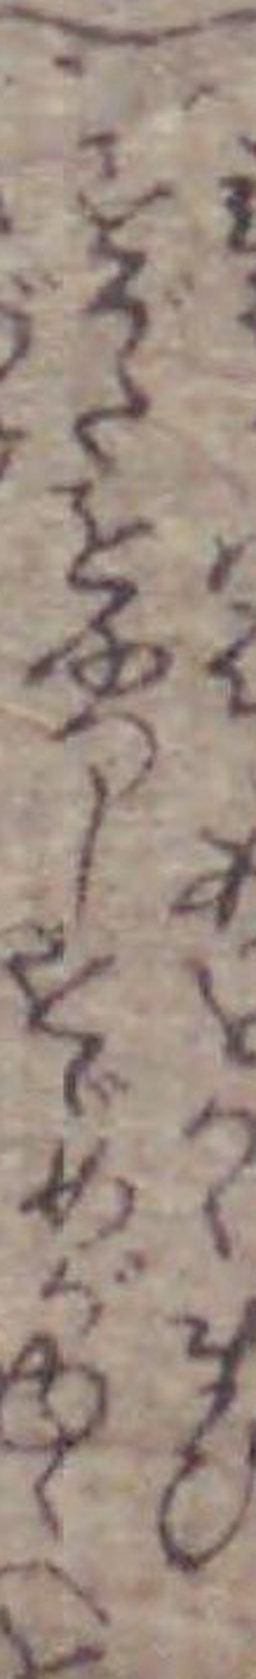すがたをやつしすゞめがゆくへを
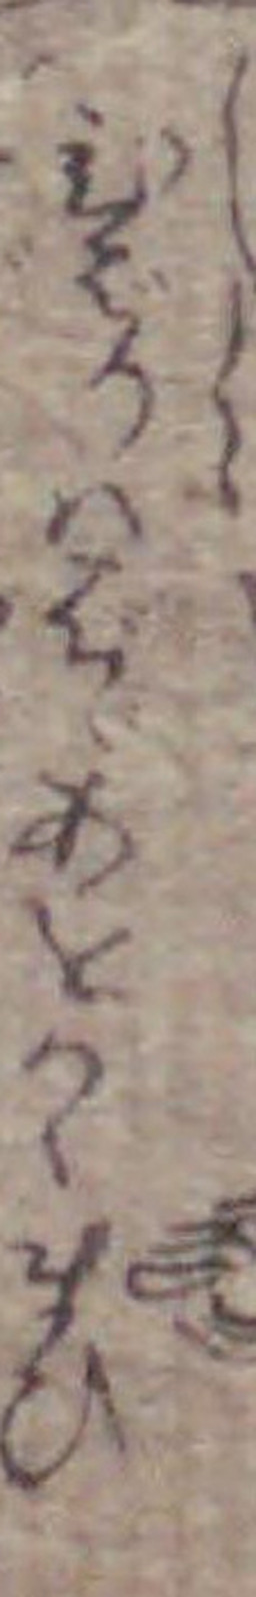ひばりはばゞあをかくまひ
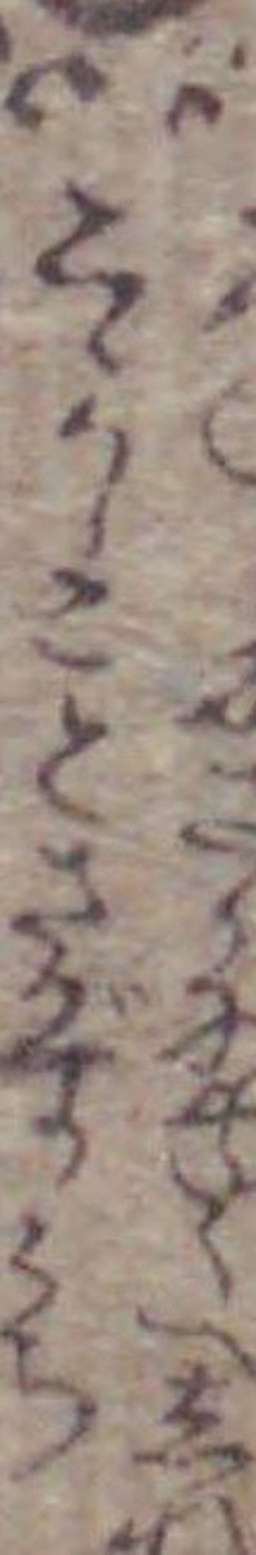こゝかしことさがすうち
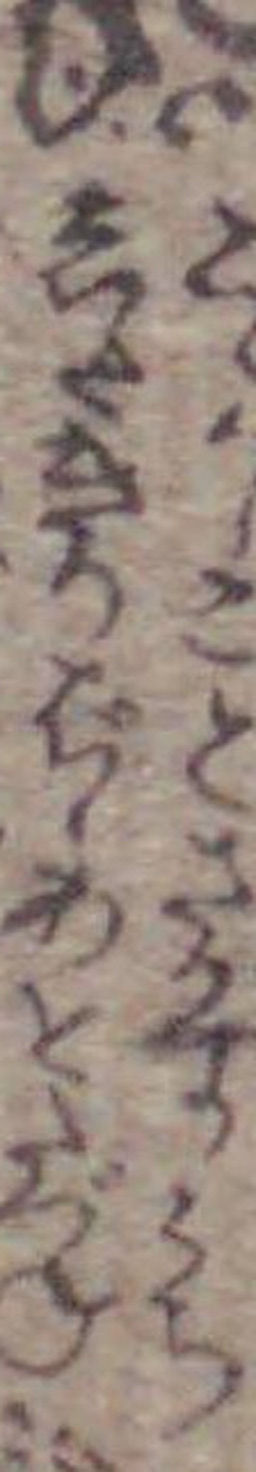したきりばゞあとたづね
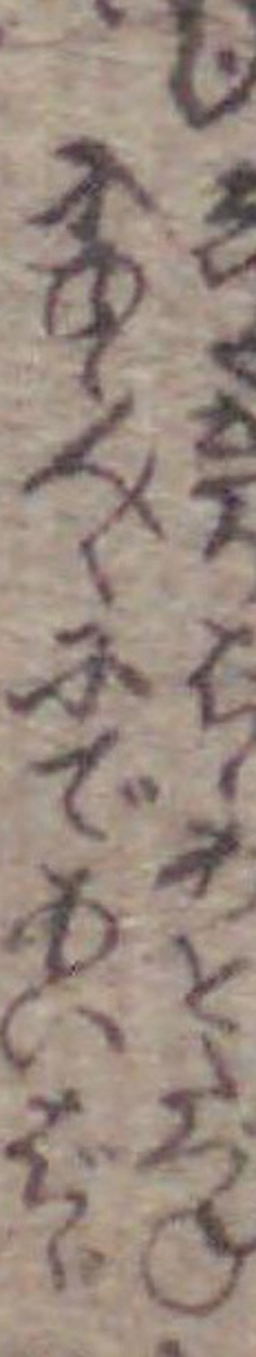にゆく人〳〵にであいばゞ
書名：嘘八百温故新知 : 2巻
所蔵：国立国会図書館 National Diet Library, JAPAN
